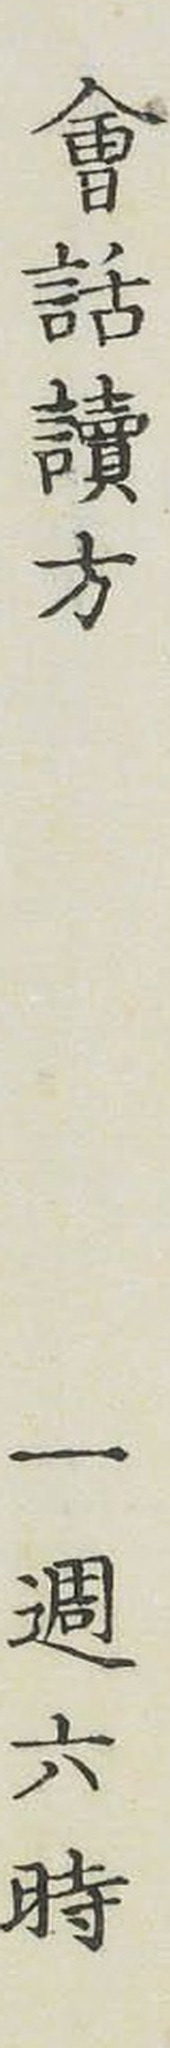会話読方一週六時
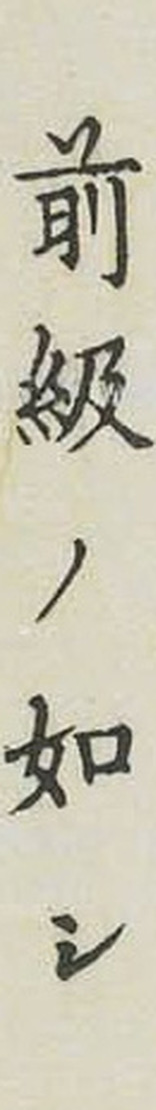前級ノ如シ
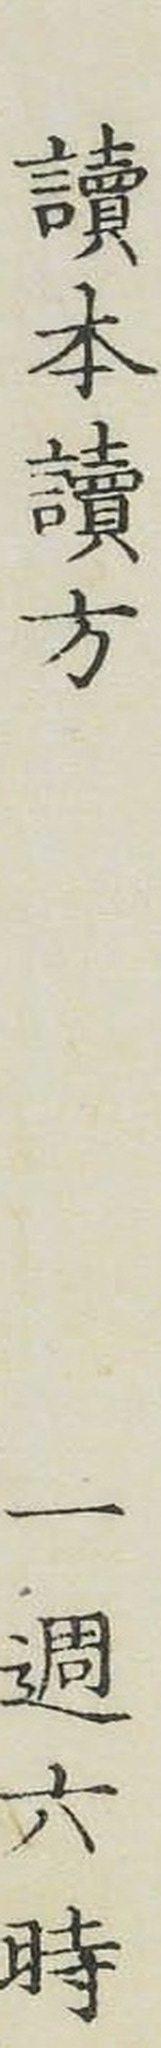読本読方一週六時
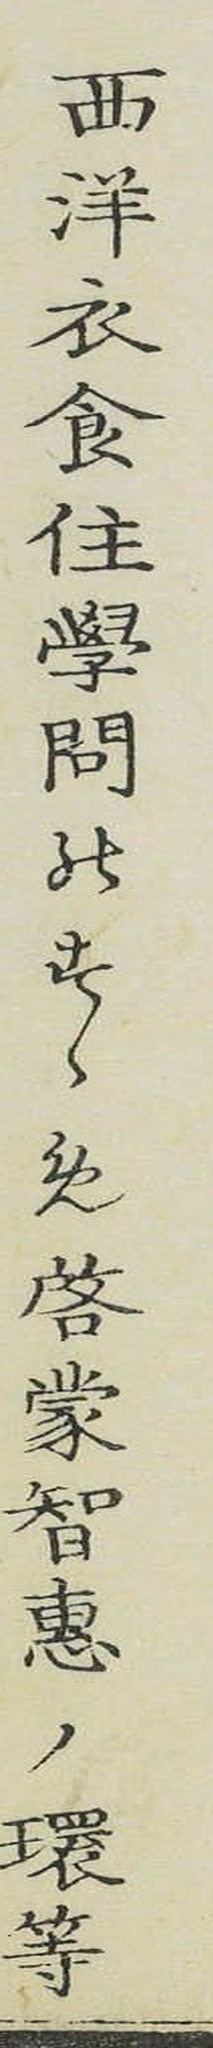西洋衣食住学問のすゝめ啓蒙知恵ノ輪等

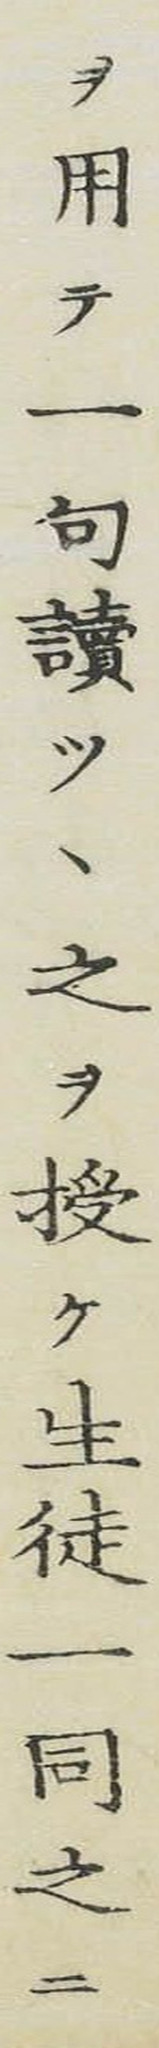ヲ用テ一句読ツヽ之ヲ授ケ生徒一同之ニ
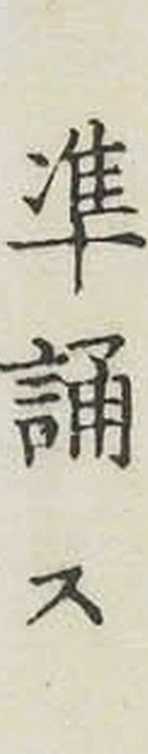準誦ス
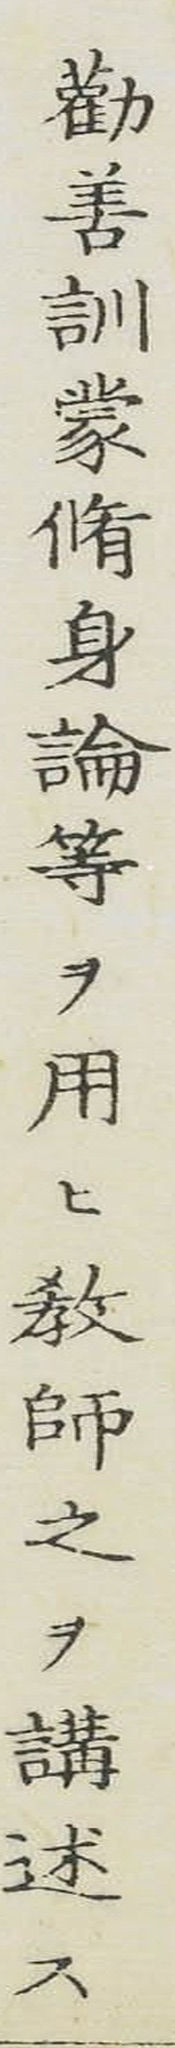勧善訓蒙脩身論等ヲ用ヒ教師之ヲ講述ス
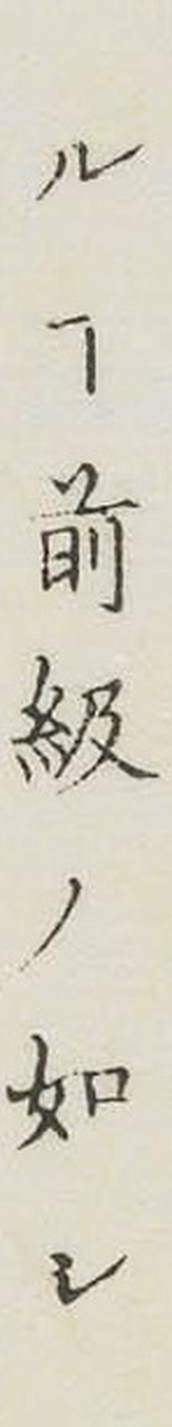ル事前級ノ如シ
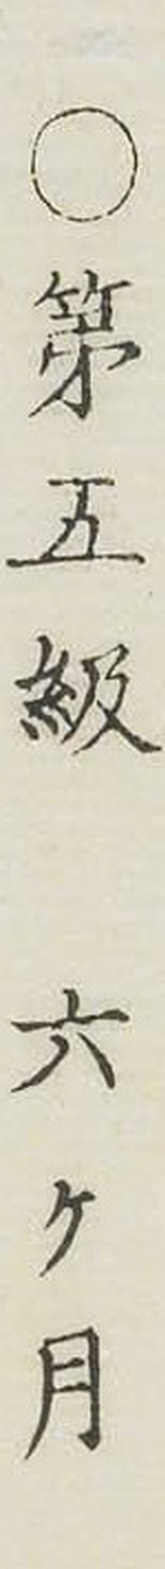○第五級六ケ月
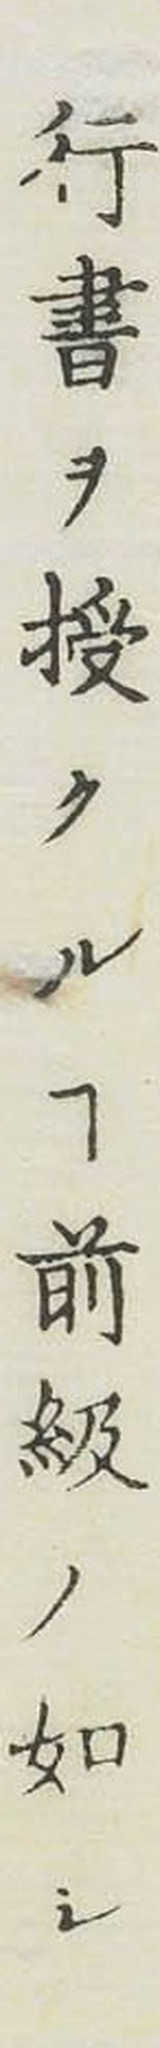行書ヲ授クル事前級ノ如シ
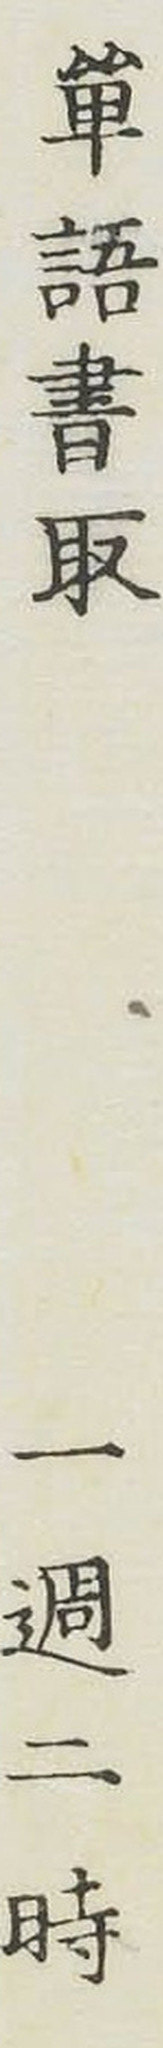単語書取一週二時
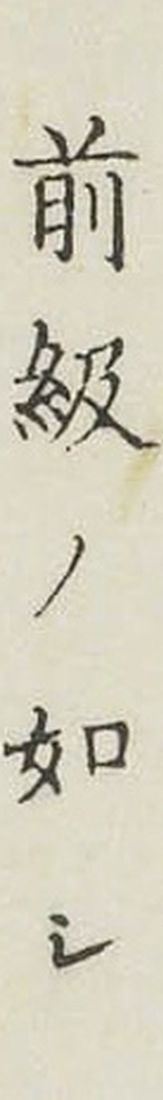前級ノ如シ
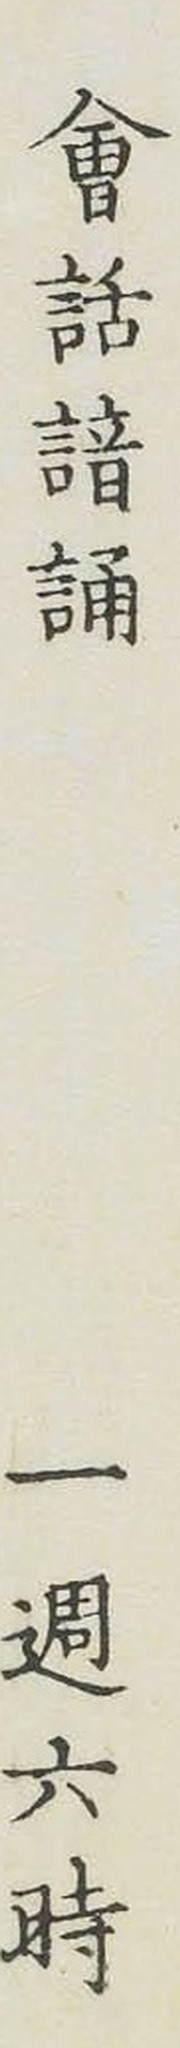会話諳誦一週六時
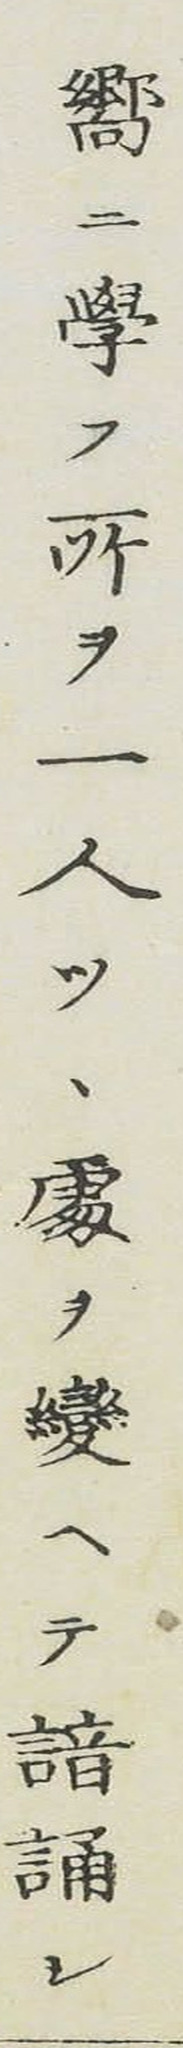嚮ニ学フ所ヲ一人ツヽ處ヲ変ヘテ諳誦シ
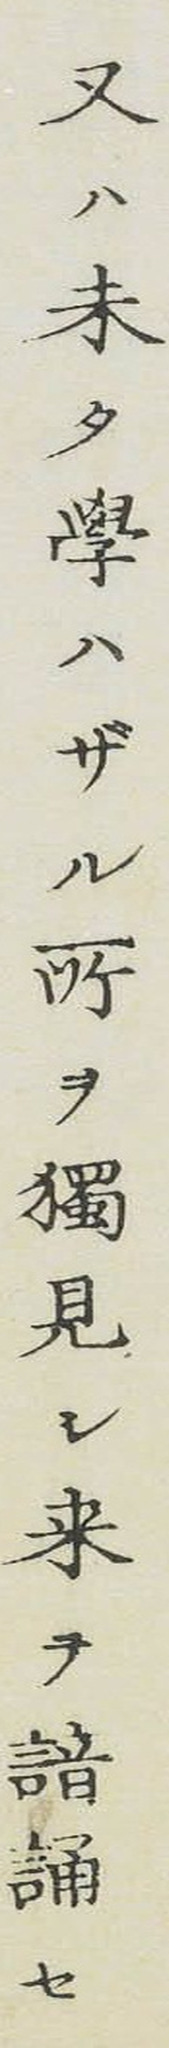又ハ未タ学ハザル所ヲ独見シ来テ諳誦セ
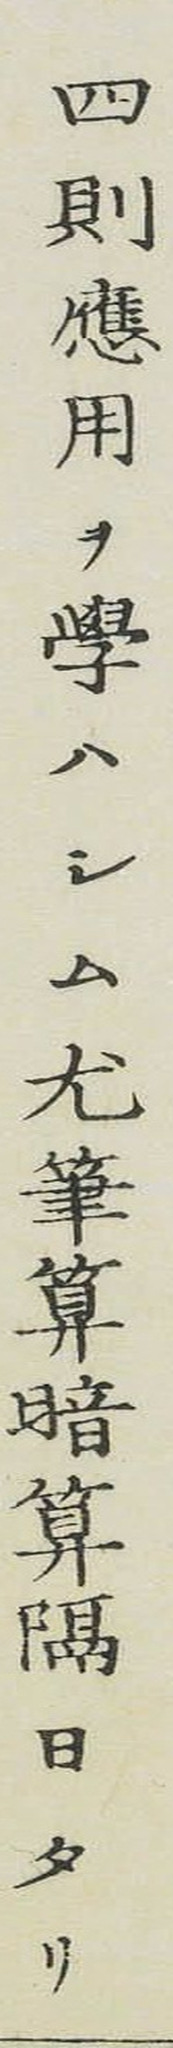四則応用ヲ学ハシム尤筆算暗算隔日タリ
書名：小学教則
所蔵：東京学芸大学教育コンテンツアーカイブ
